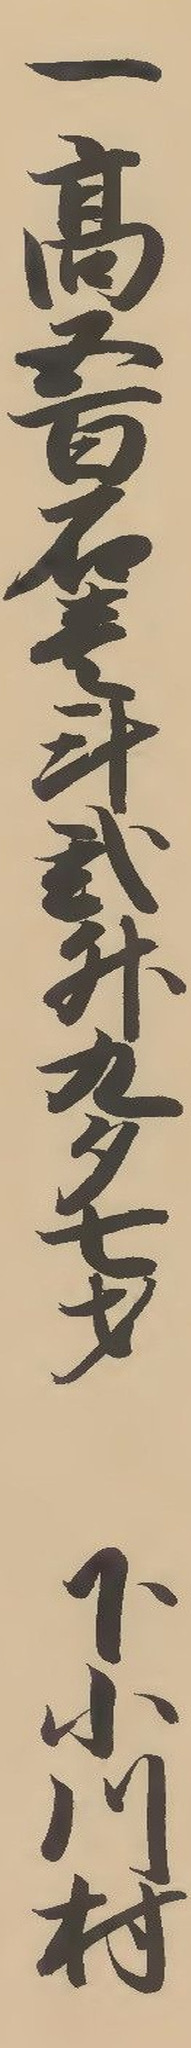一高五百石壱斗弐升九勺七才下小川村
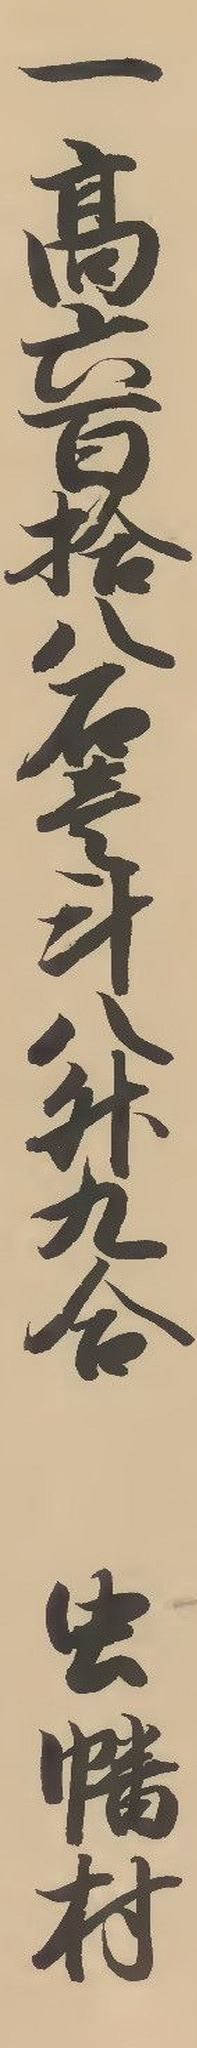一高六百拾八石壱斗八升九合虫幡村
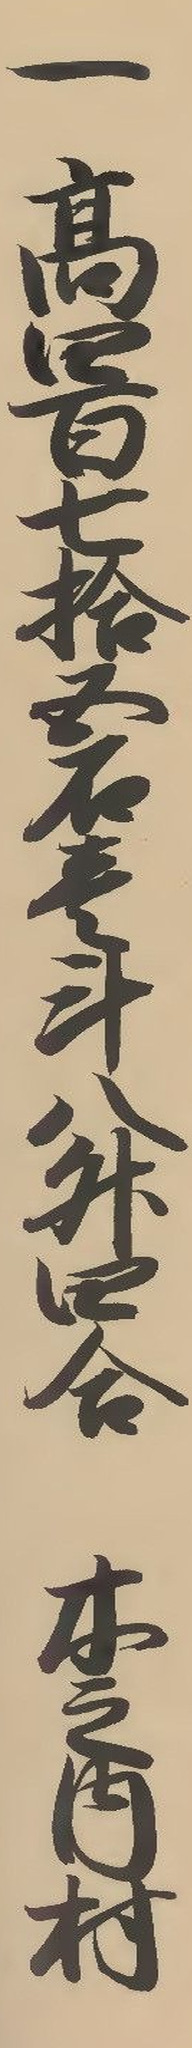一高四百七拾五石壱斗八升四合木之内村
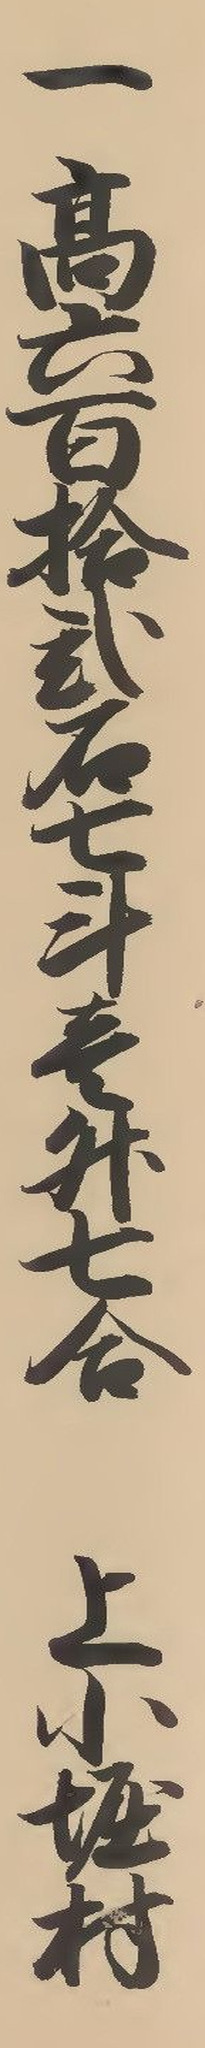一高六百拾弐石七斗壱升七合上小堀村
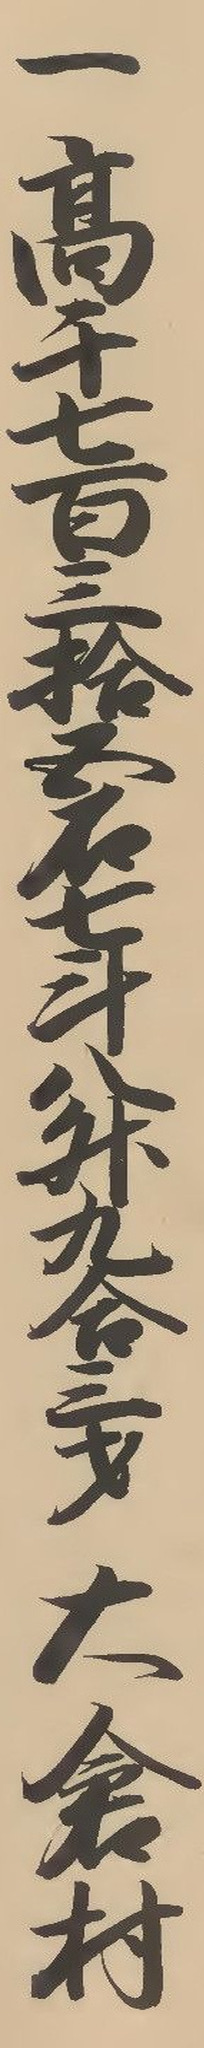一高千七百三拾五石七斗八升九合三才大倉村
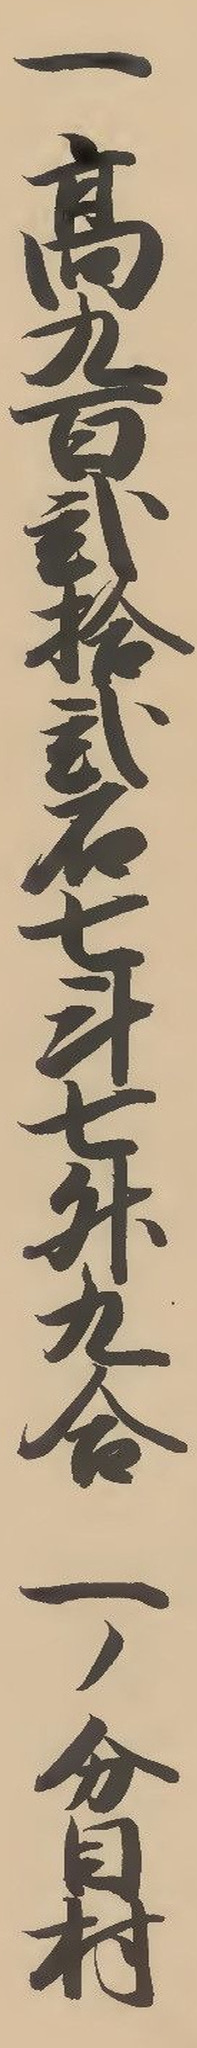一高九百弐拾弐石七斗七升九合一ノ分目村
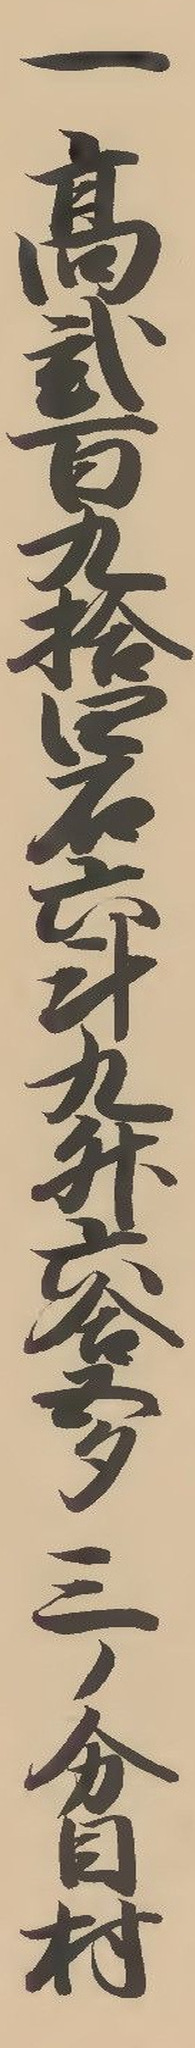一高弐百九拾四石六斗九升六合五勺三ノ分目村

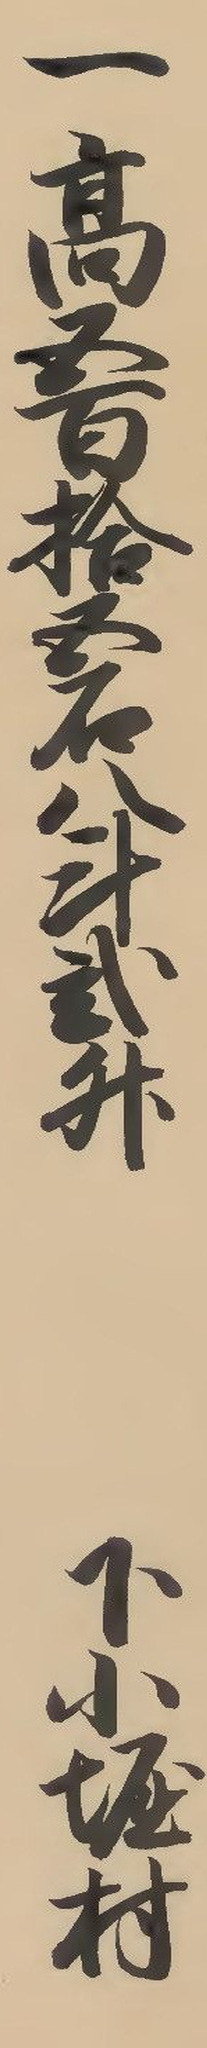一高五百拾五石八斗弐升下小堀村
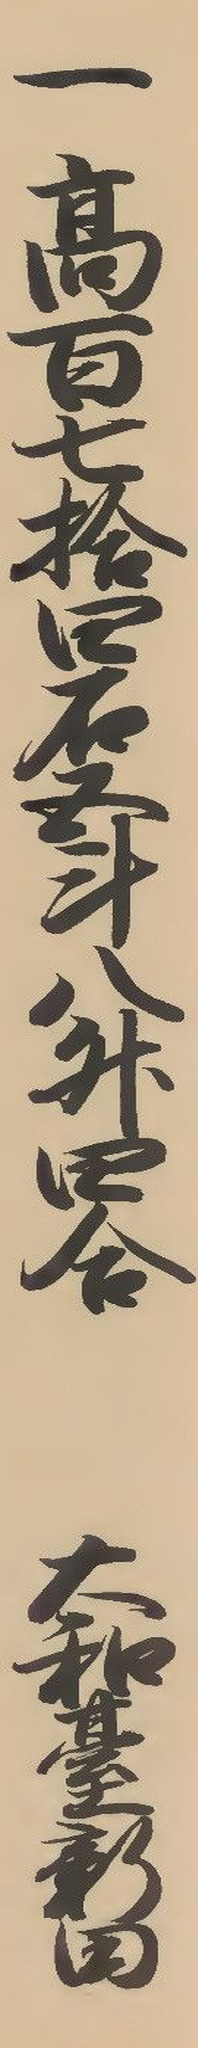一高百七拾四石五斗八升四合大和台新田

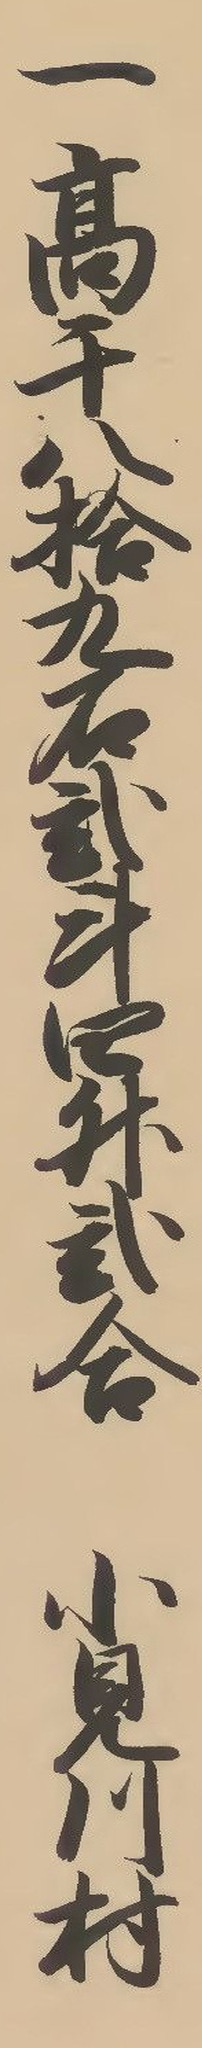一高千八拾九石弐斗四升弐合小見川村
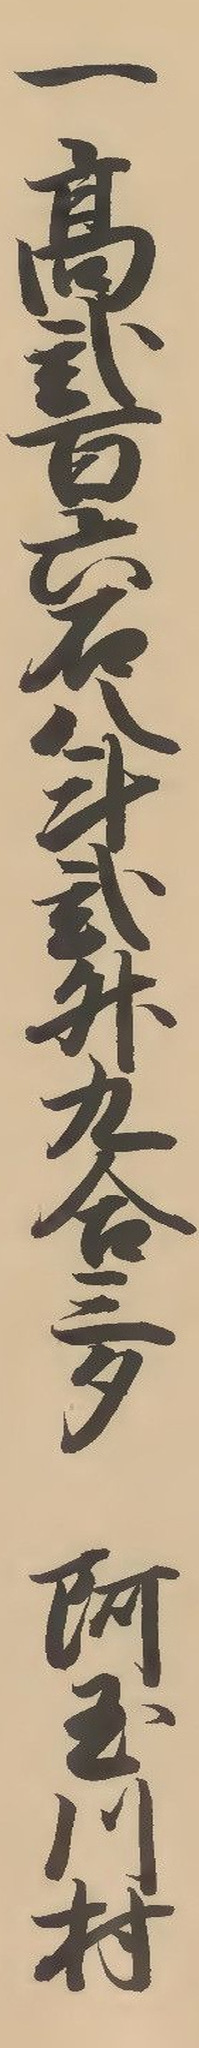一高弐百六石八斗弐升九合三勺阿玉川村
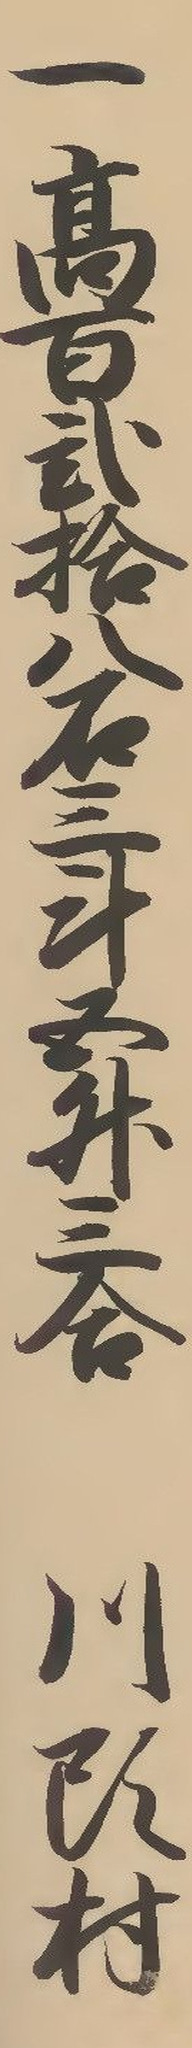一高百弐拾八石三斗五升三合川頭村
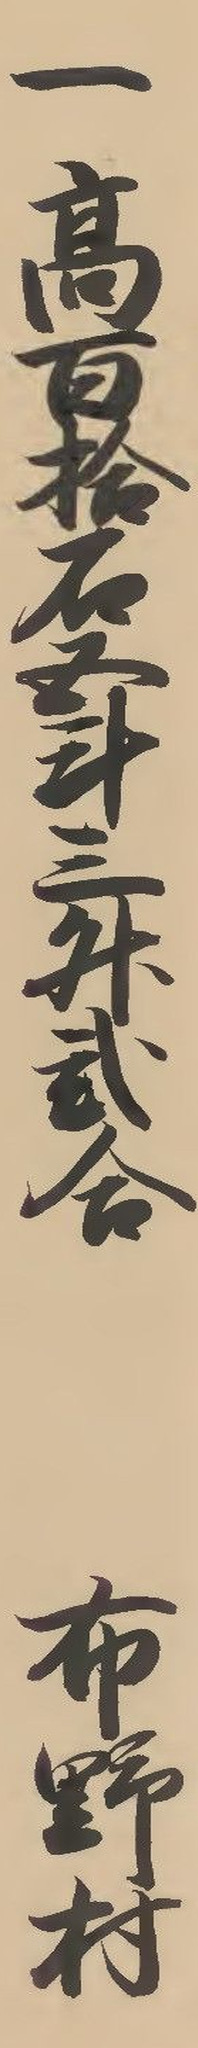一高百拾石五斗三升弐合布野村
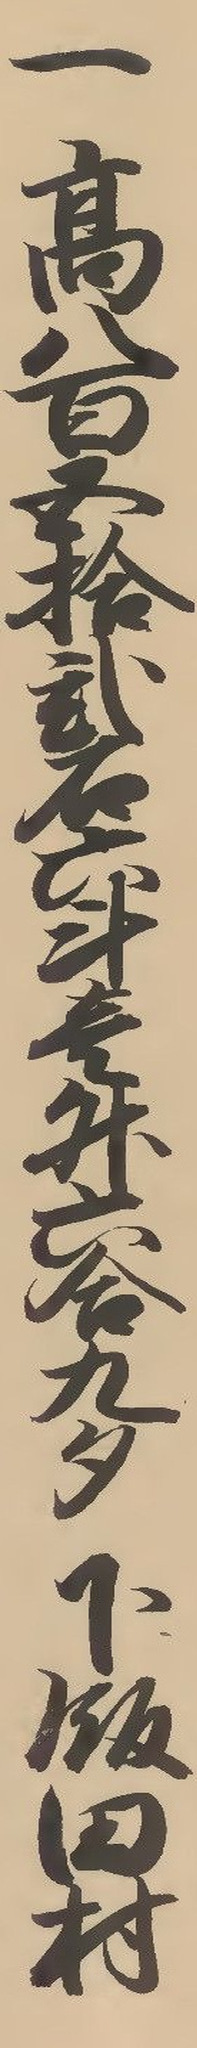一高八百五拾弐石六斗壱升六合九勺下飯田村
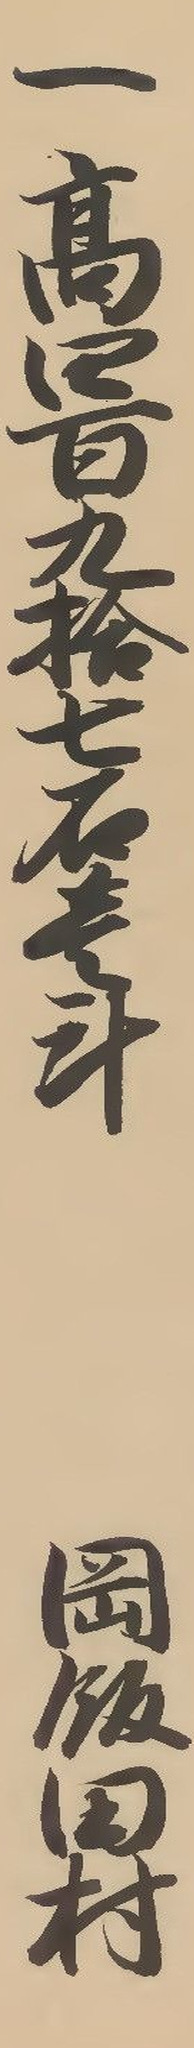一高四百九拾七石壱斗岡飯田村
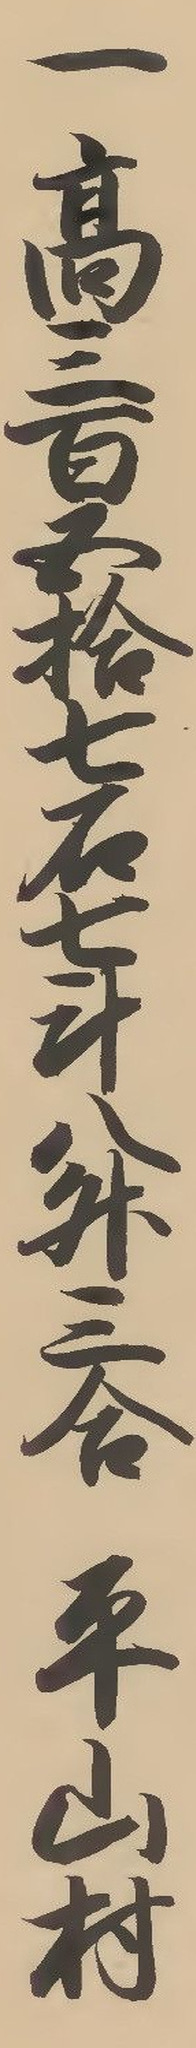一高三百五拾七石七斗八升三合平山村
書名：下総国郷帳
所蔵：国立公文書館 National Archives of Japan
